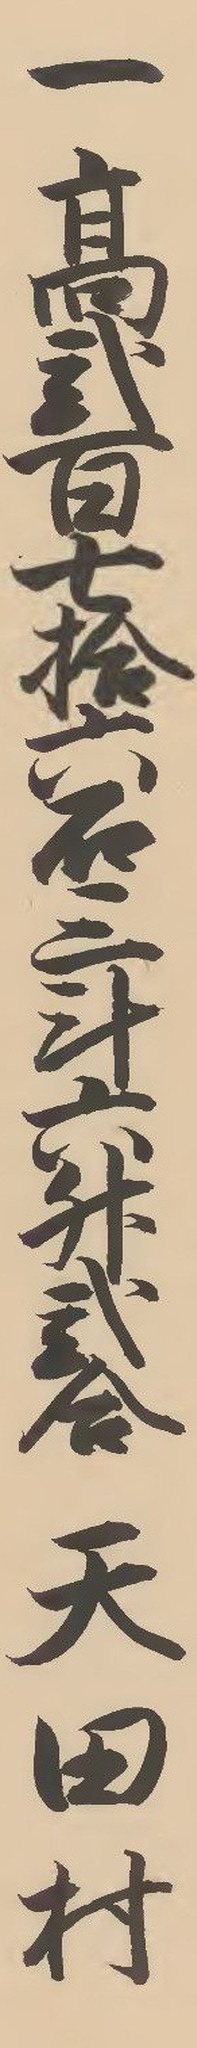一髙弐百七拾六石三斗六升弐合天田村

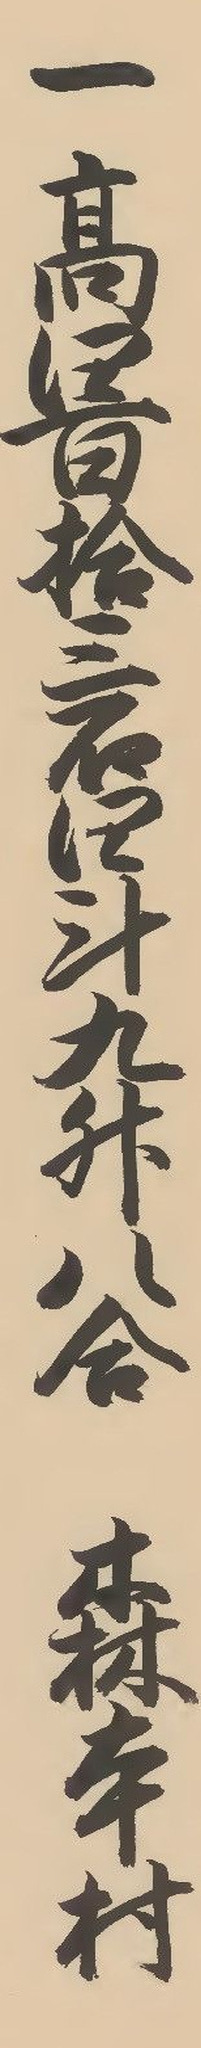一髙四百拾三石四斗九升八合森本村
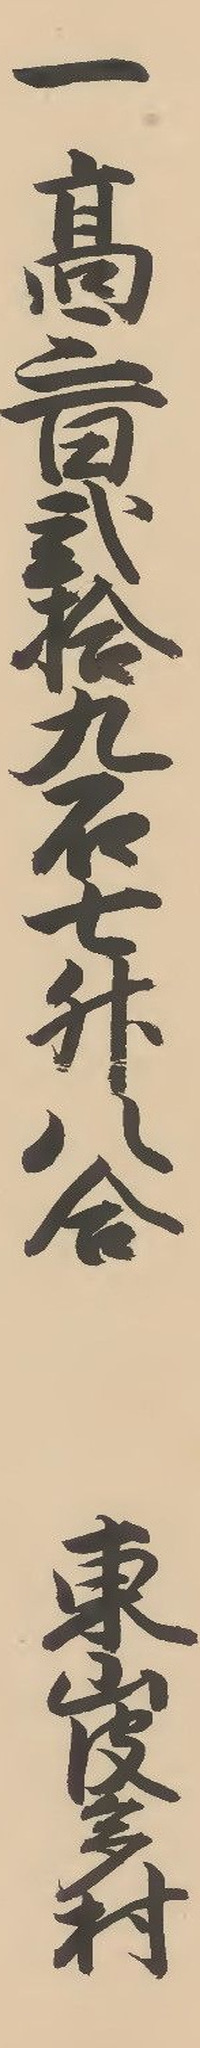一髙三百弐拾九石七升八合東山皮多村
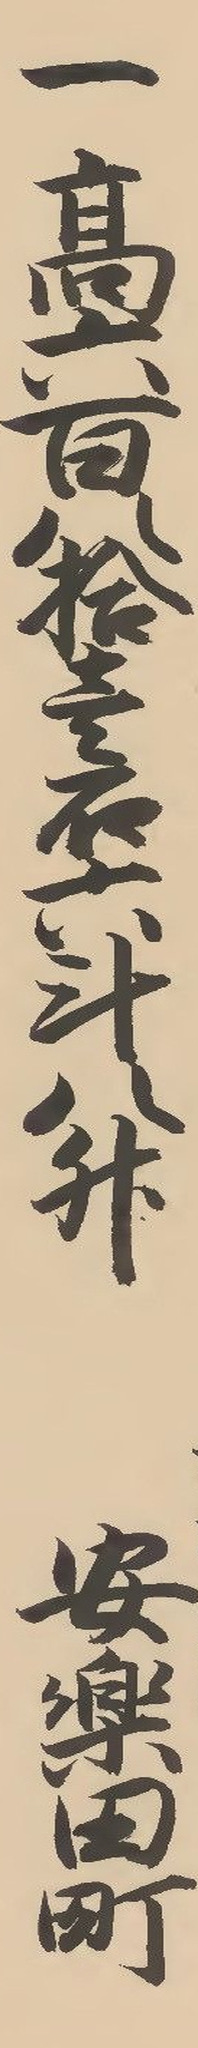一髙六百八拾壱石六斗八升安樂田町
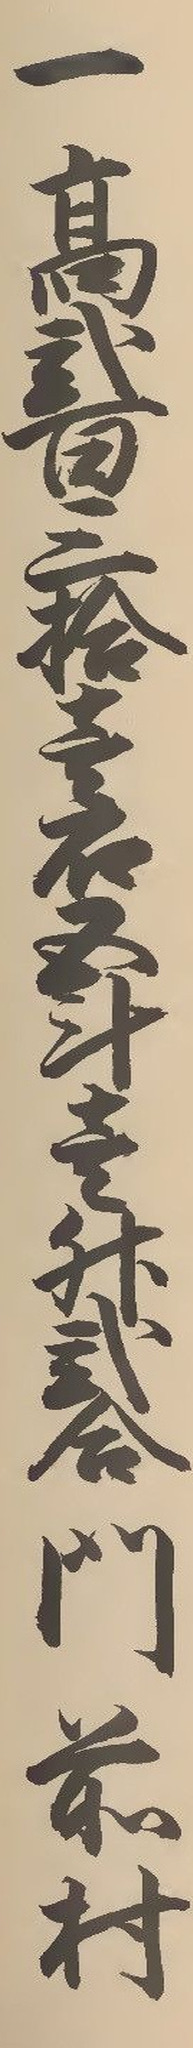一髙弐百三拾壱石五斗壱升弐合門前村
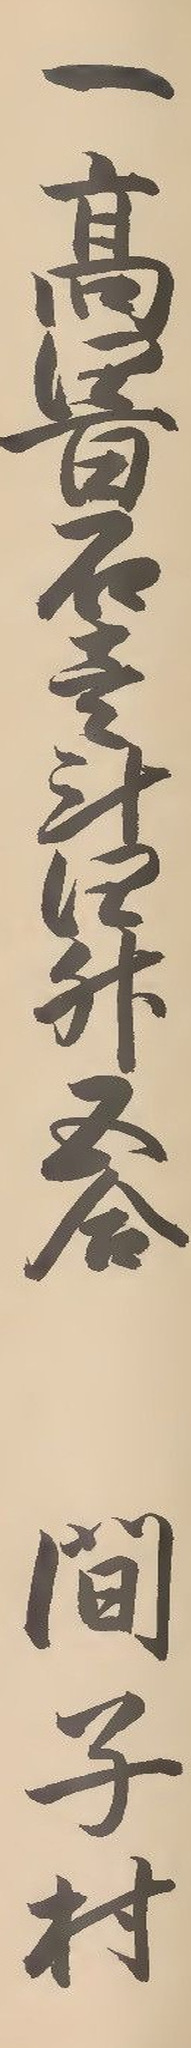一髙四百石壱斗四升五合間子村
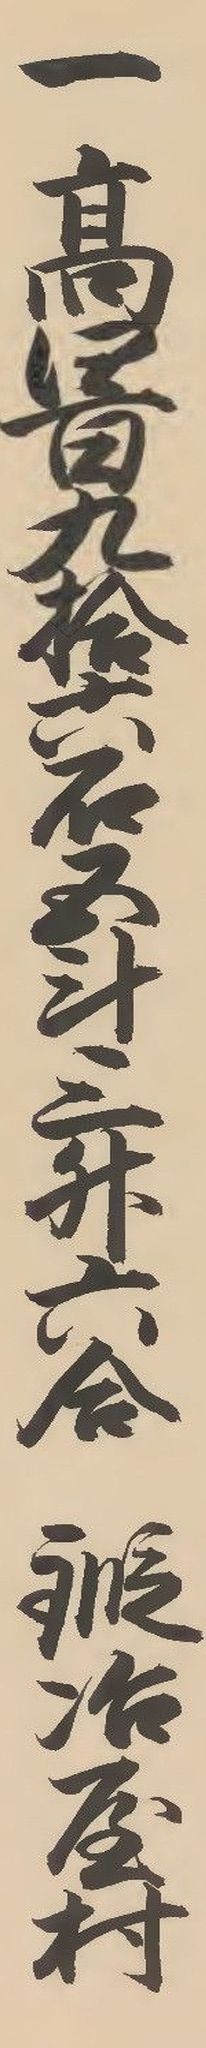一髙四百九拾六石五斗三升六合鍛冶屋村
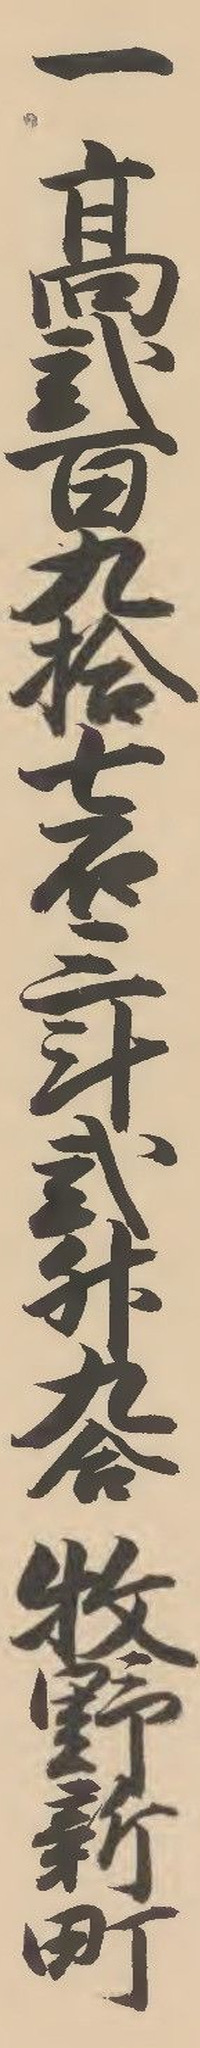一髙弐百九拾七石三斗弐升九合牧野新町
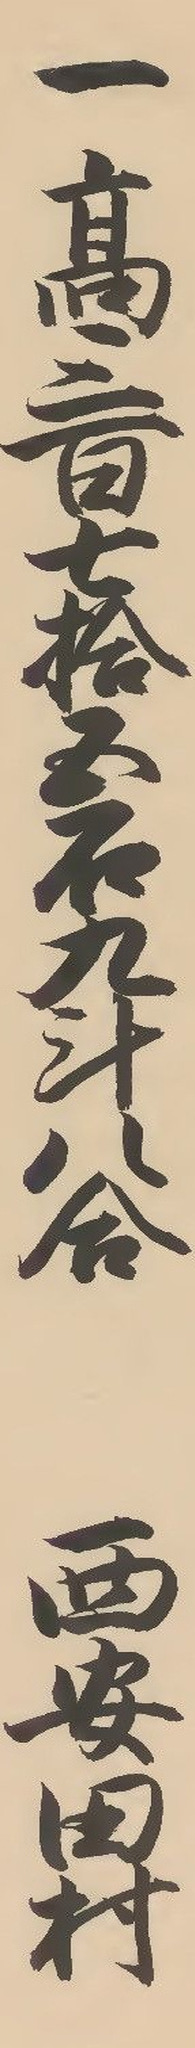一髙三百七拾五石九斗八合西安田村

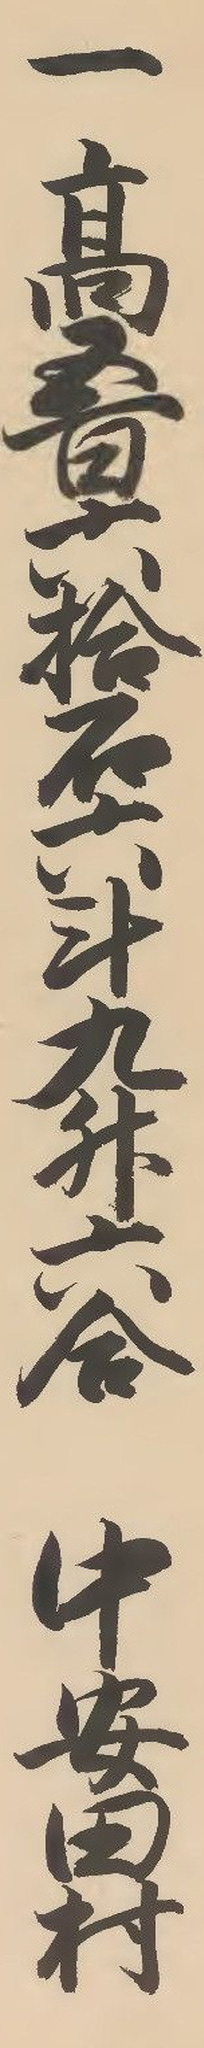一髙五百六拾石六斗九升六合中安田村
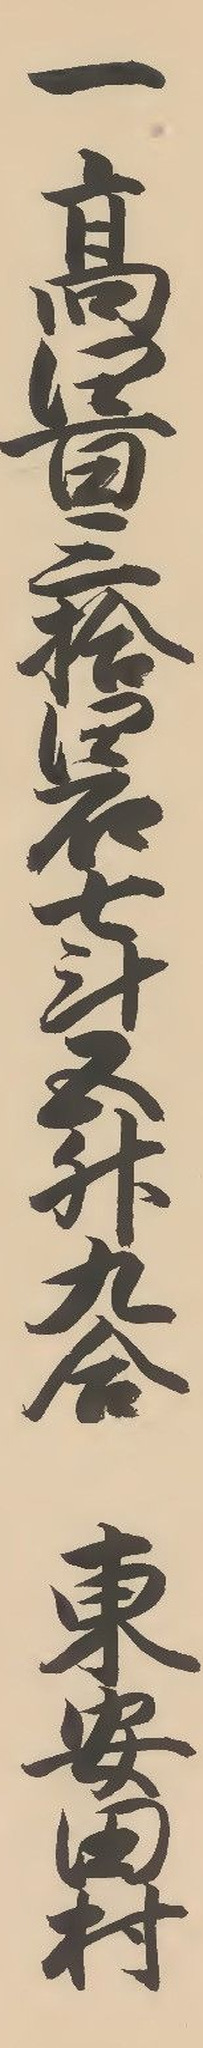一髙四百三拾四石七斗五升九合東安田村
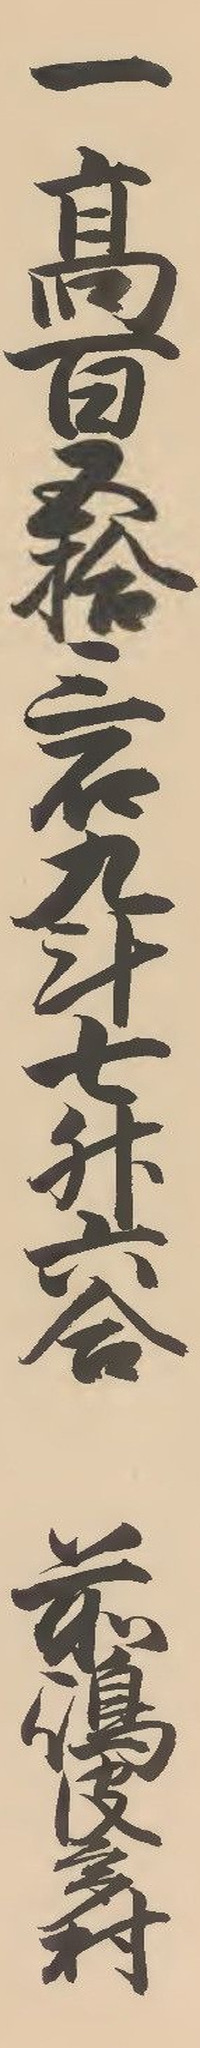一髙五拾三石九斗七升六合前嶋皮多村
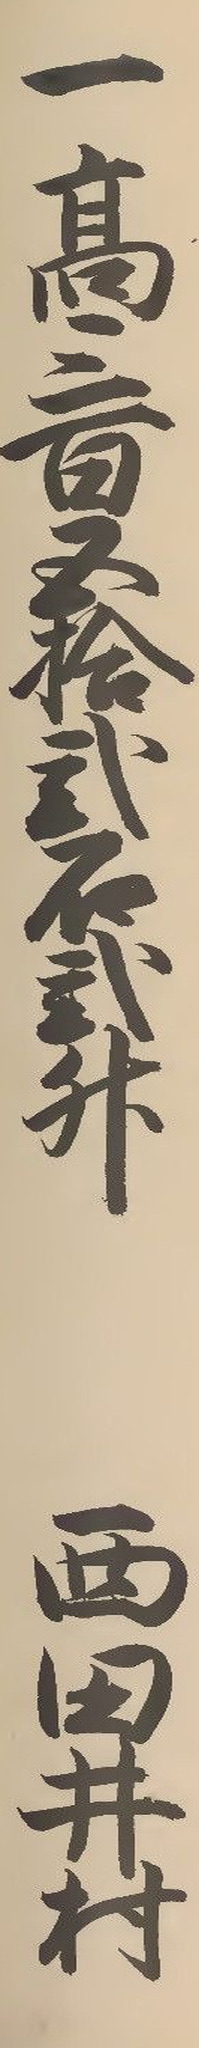一髙三百五拾弐石弐升西田井村
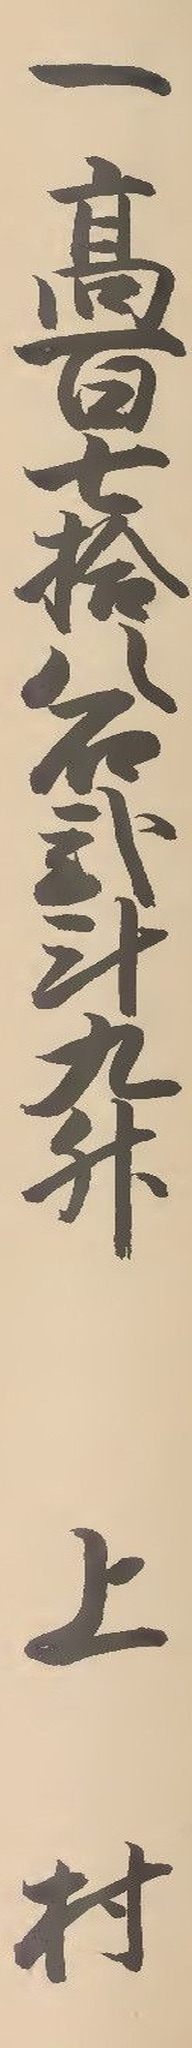一髙百七拾八石弐斗九升上村
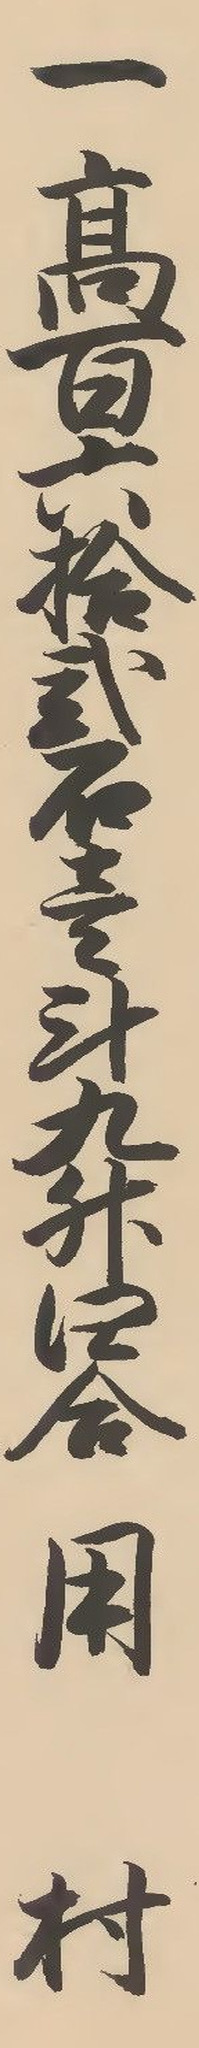一髙百六拾弐石壱斗九升四合用村
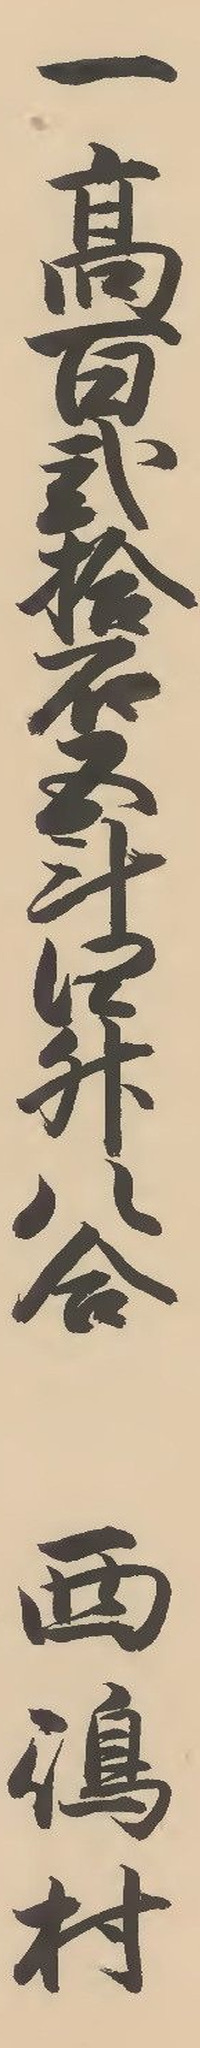一髙百弐拾石五斗四升八合西嶋村
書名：播磨国郷帳
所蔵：国立公文書館 National Archives of Japan
